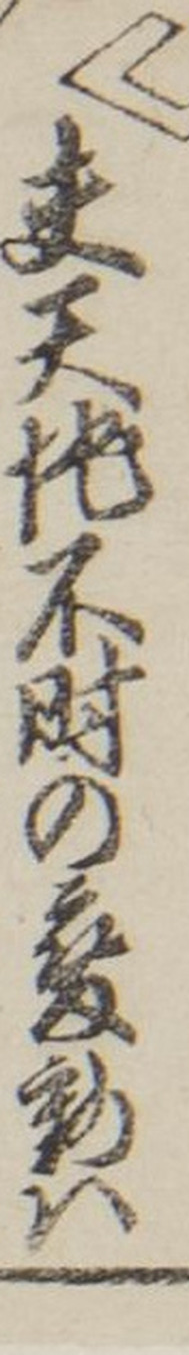夫天地不時の変動は
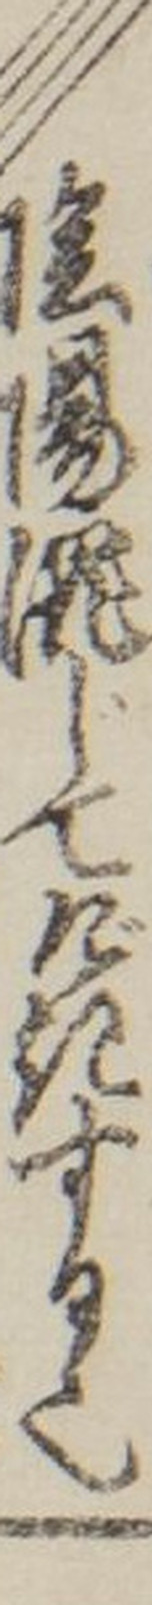陰陽混じてげきする也
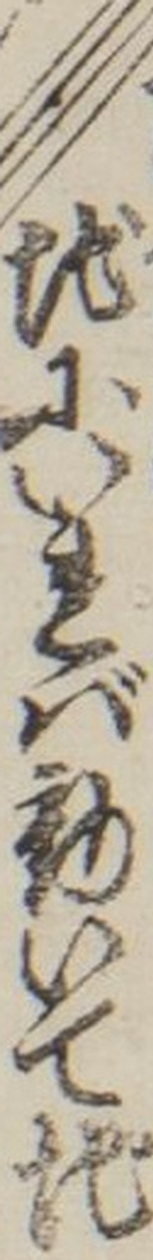地にいれば動いて地
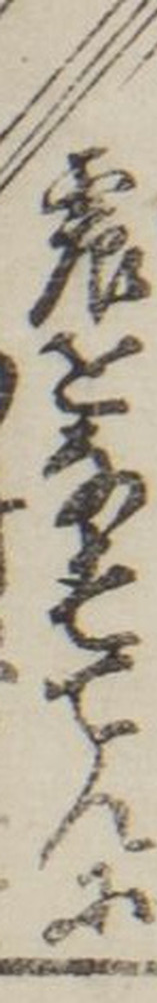震となすてんに
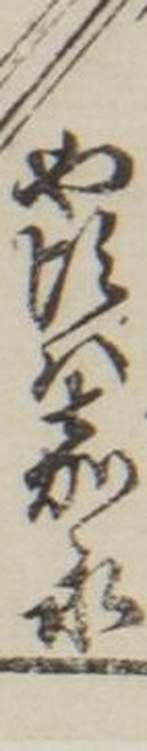や頃は嘉永
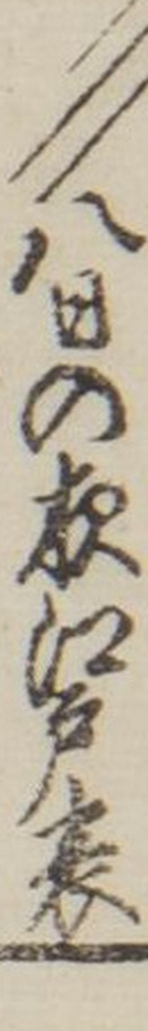八日の夜江戸表
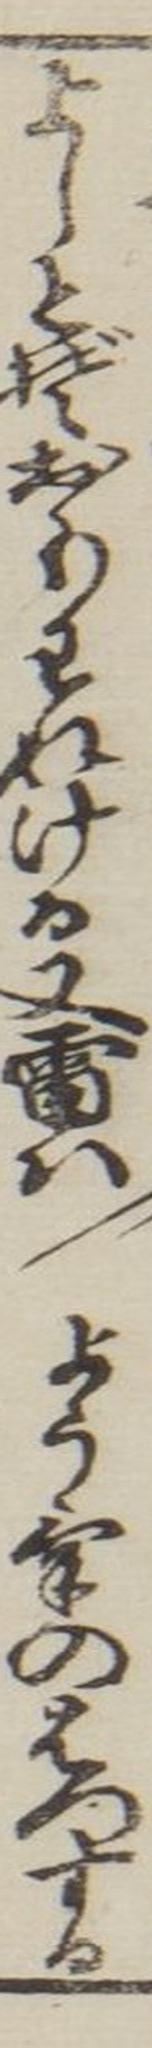よしとぞおもわれける又雷はよう気のはつする
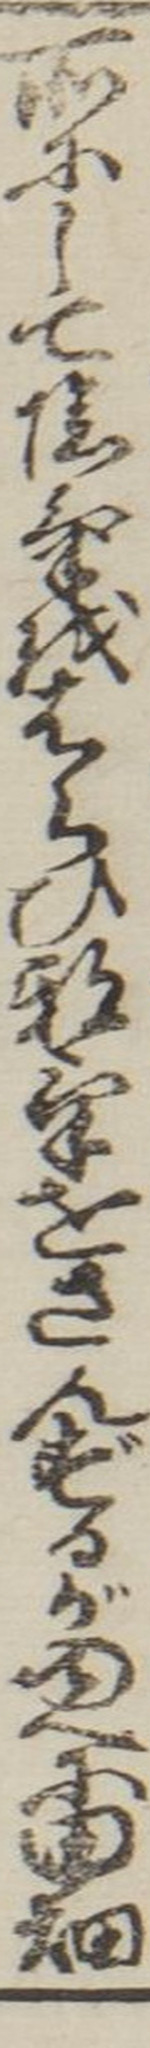所にして陰気をはらひ邪気をさんずるがゆへに田畑
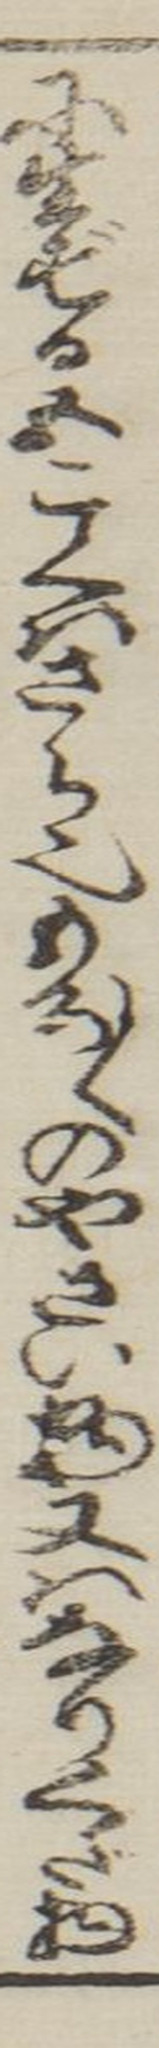に生ずる五こくはさら也もろ〳〵のやさい物又はなりくだ物
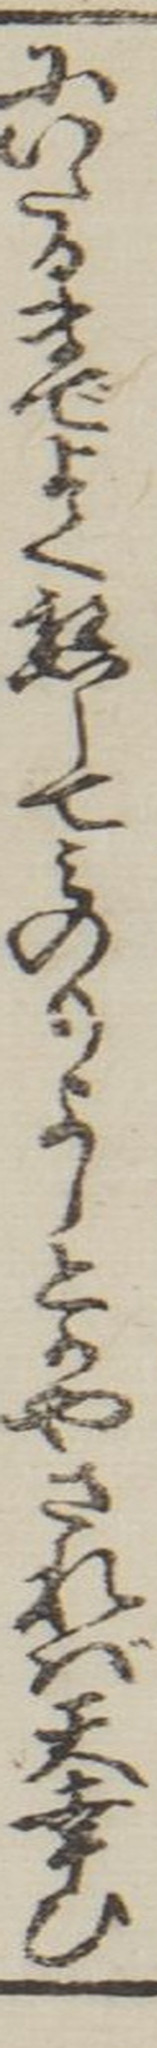にいたるまでよく熟してみのりよしとかやされば天幸ひ
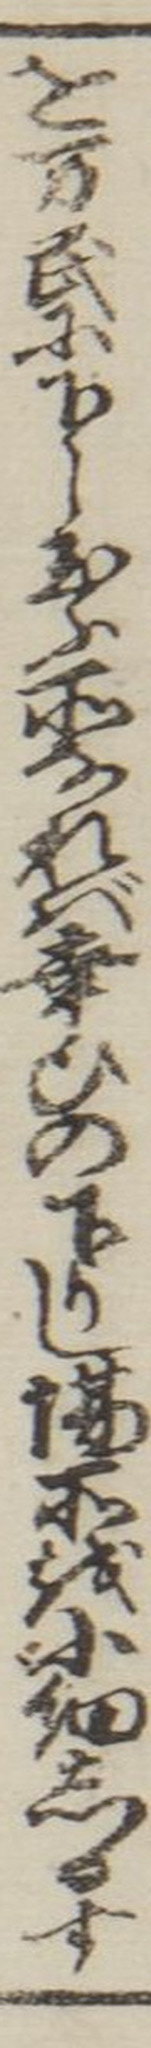を万民に下し玉ふ所なれば幸ひの下りし場所を小細しるす
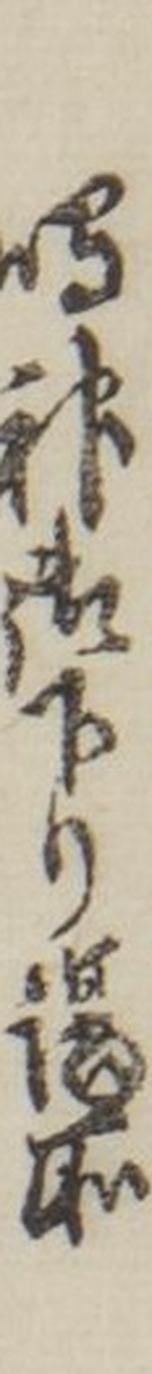鳴神御下り場所
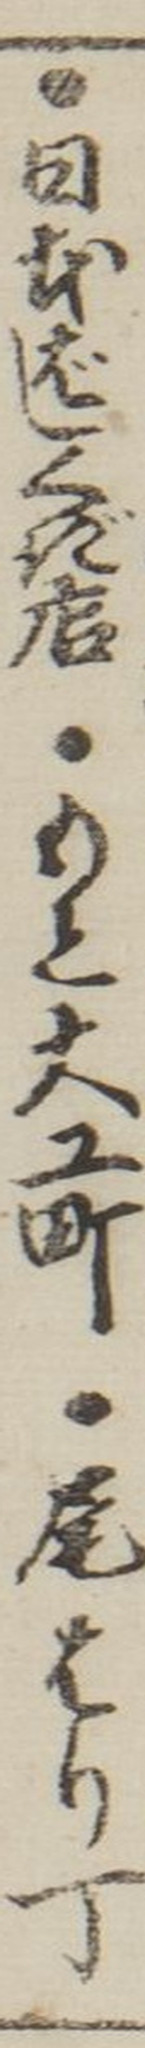●日本ばしくぎ店●もと大工町●尾はり丁
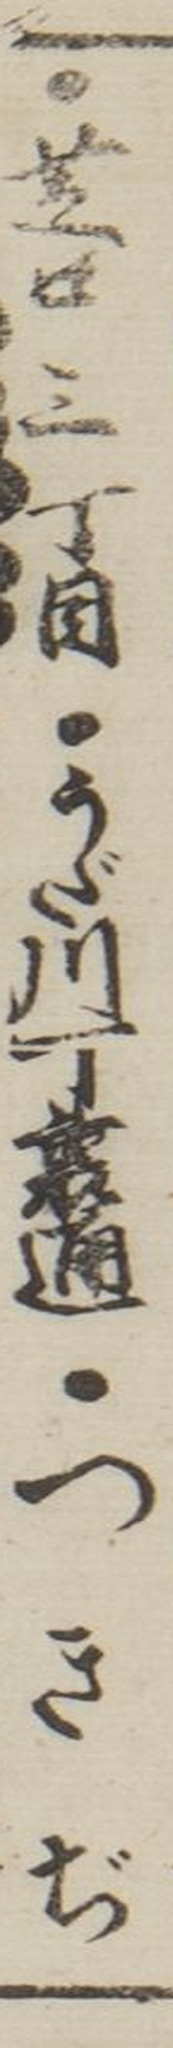●芝口三丁目●うだ川丁裏通●つきぢ
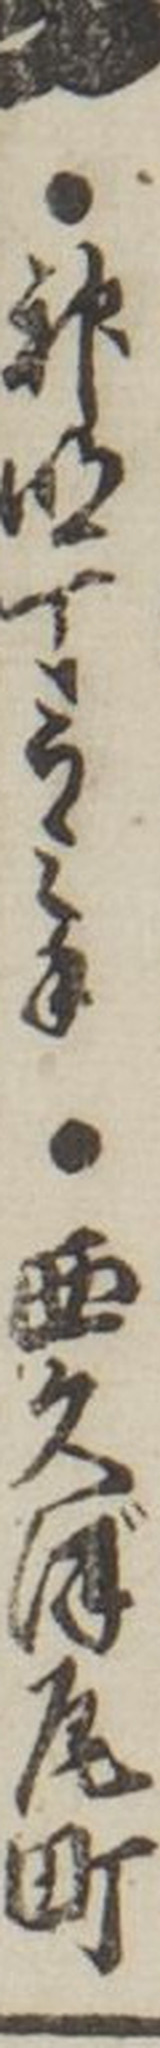●神明丁うみ手●西久ぼ尾町
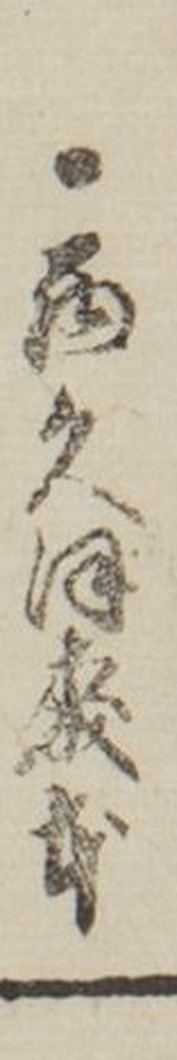●西久ぼ森本
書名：嘉永三年江戸落雷の図
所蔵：あいおいニッセイ同和損保株式会社
